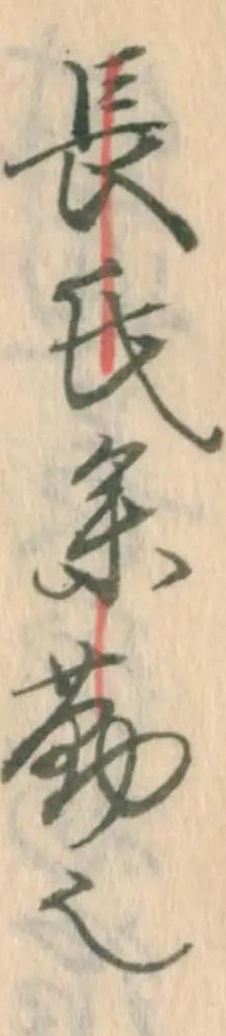長氏参-勤也
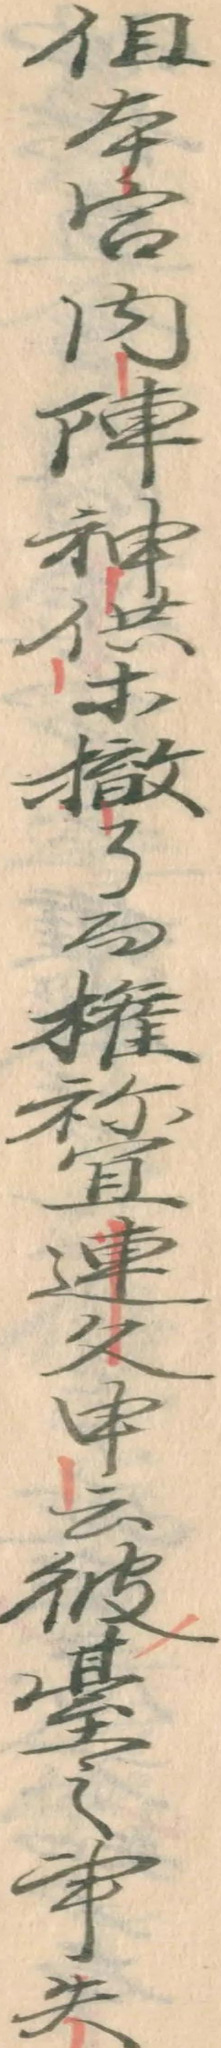但本-宮内-陣神-供_等撒-了而権祢宜連久申_云彼台之事失-

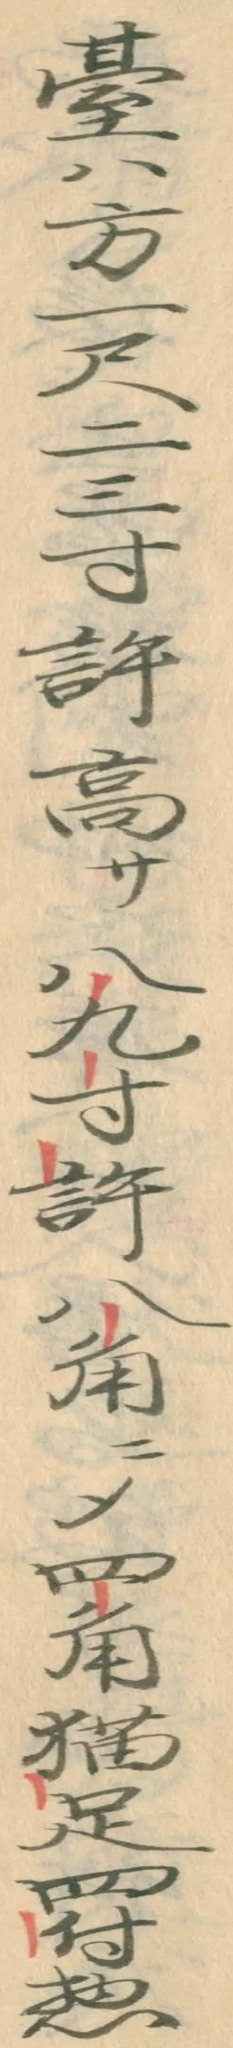台ハ方一尺二三寸許高サ八-九-寸_許八-角ニシテ四-角猫_足四_付惣
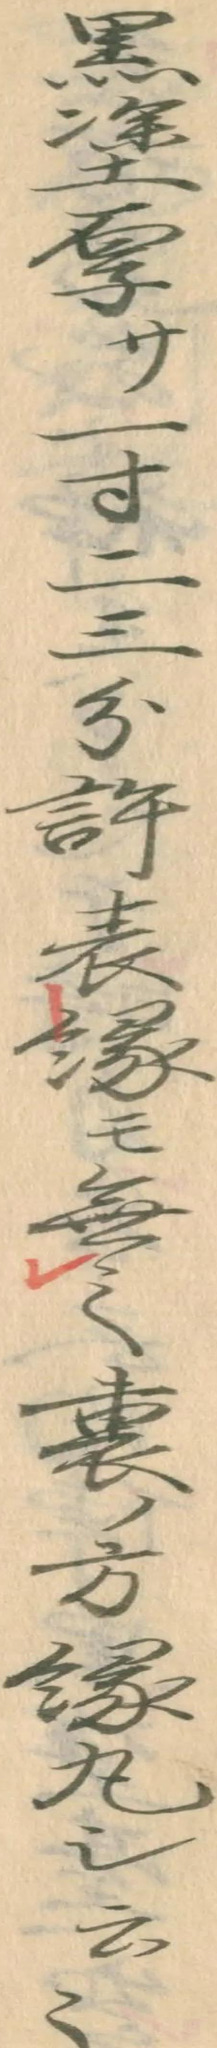黒塗厚サ一寸二三分許表_縁モ無之裏ノ方縁丸シ云々
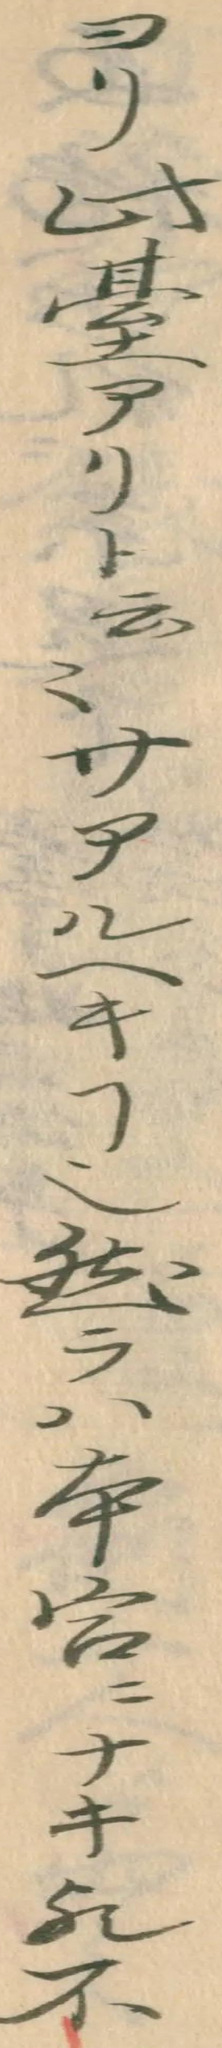ヨリ此台アリト云々サアルヘキコト也然ラハ本宮ニナキ歟不-
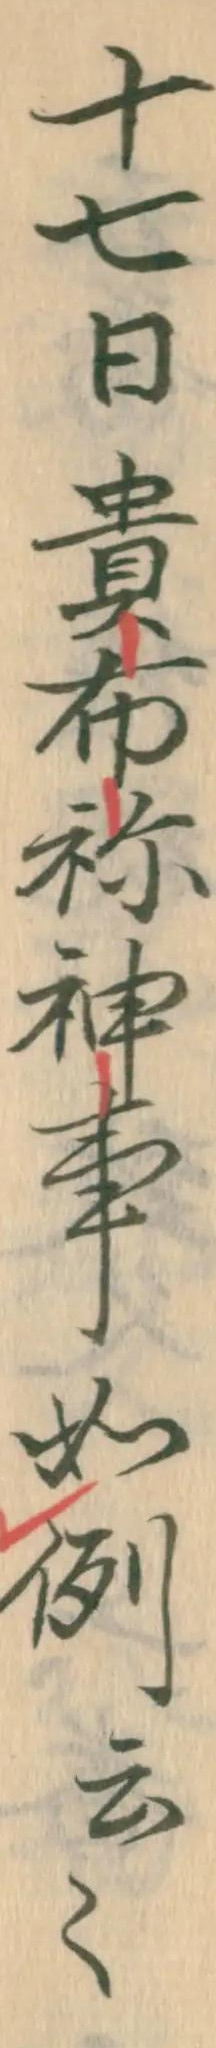十七日貴-布-称神-事如例云々
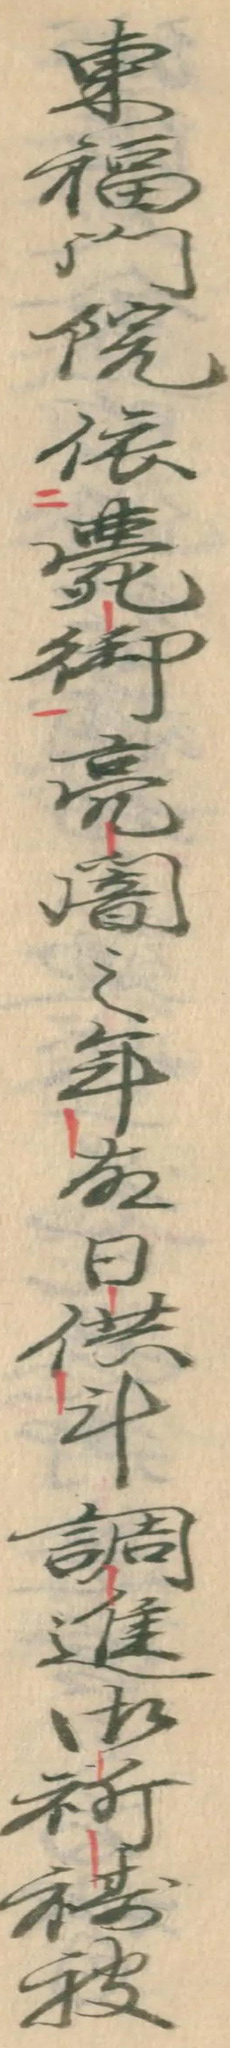東福門院依薨-御亮-闇之年_故日-供_計調-進御-祈-祷被
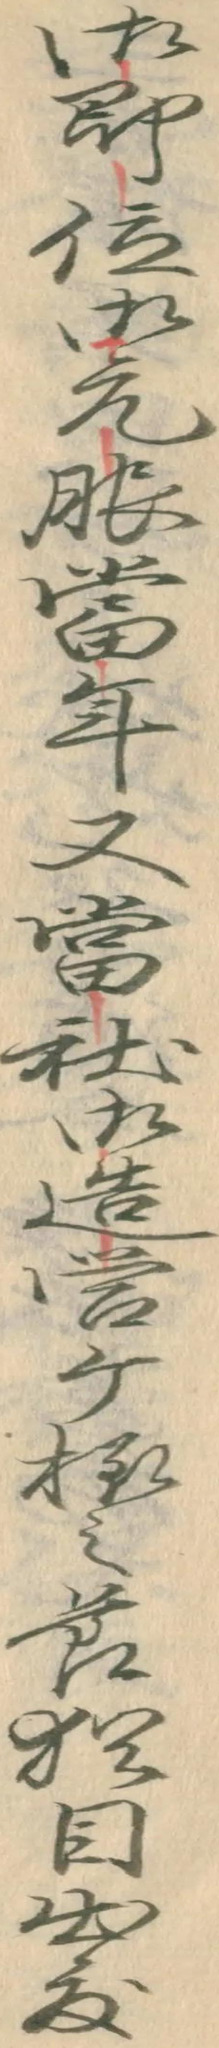御-即-位御-元-服当年又当-社御-造-営ケ様之節猶目出度
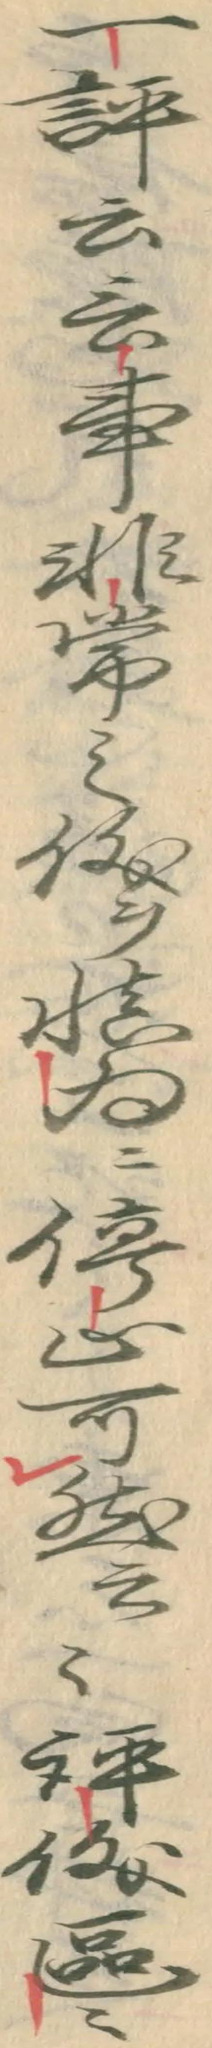一-評云言-事非-常之儀ヲ慎_為ニ停-止可然云々評-儀区_々

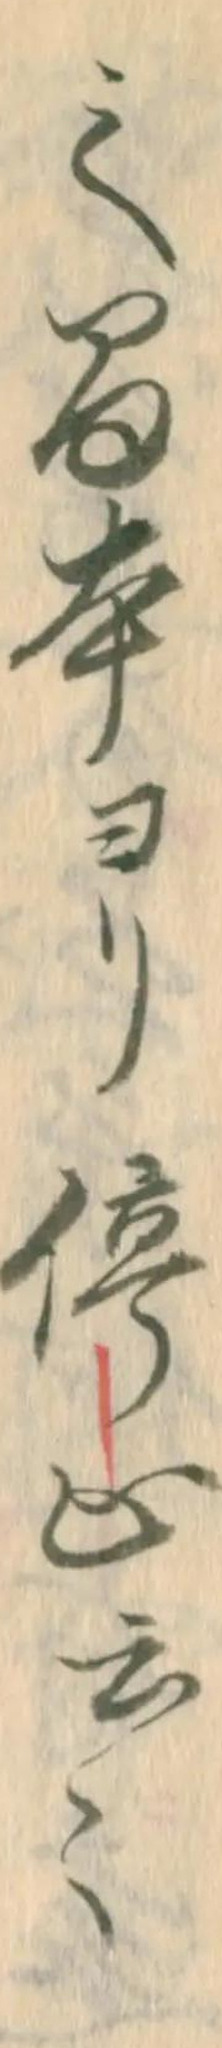之間本ヨリ停-止云々
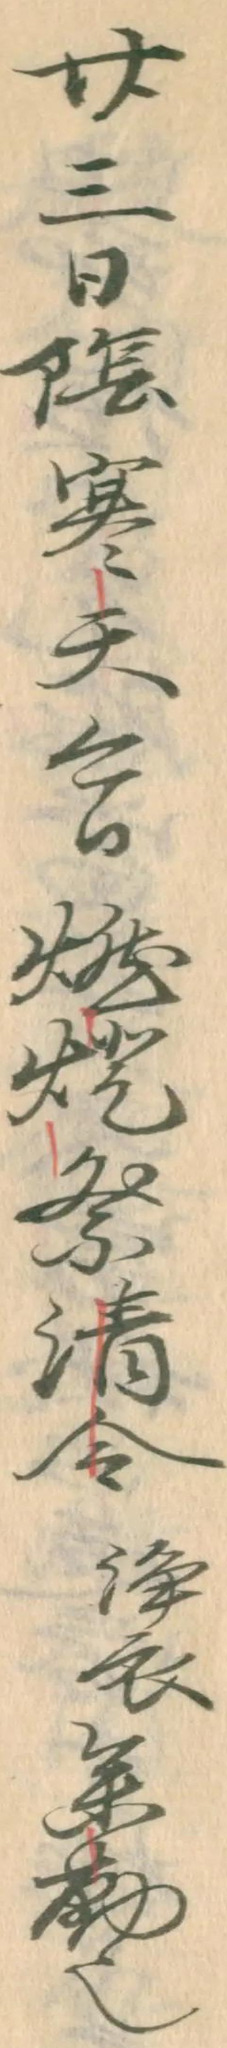廿三日陰寒-天今日燃-燈_祭清令浄衣参-勤也
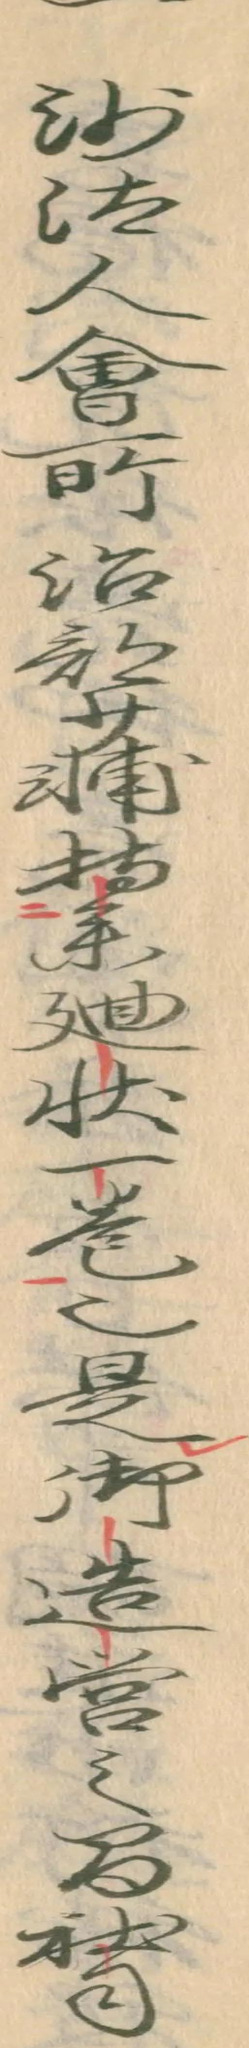一沙汰人会所治部少輔持-参廻-状一-巻也是御-造-営之間社-司
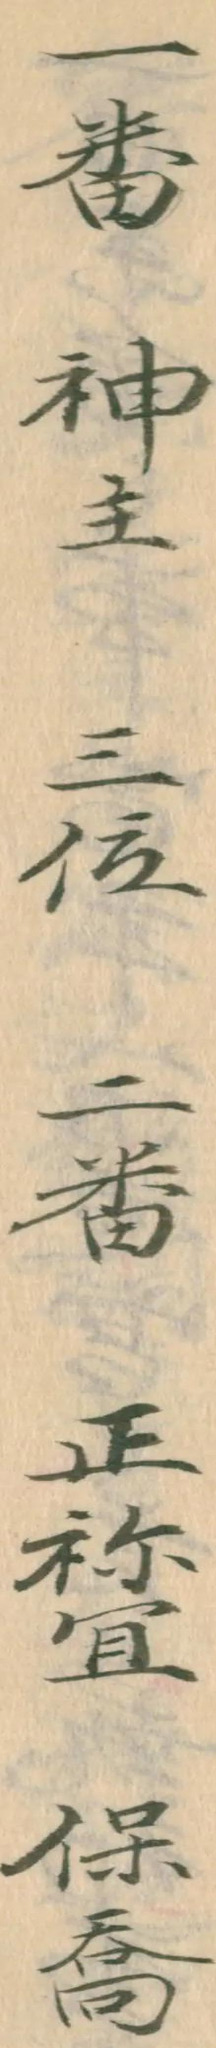一番神主三位二番正祢宜保喬
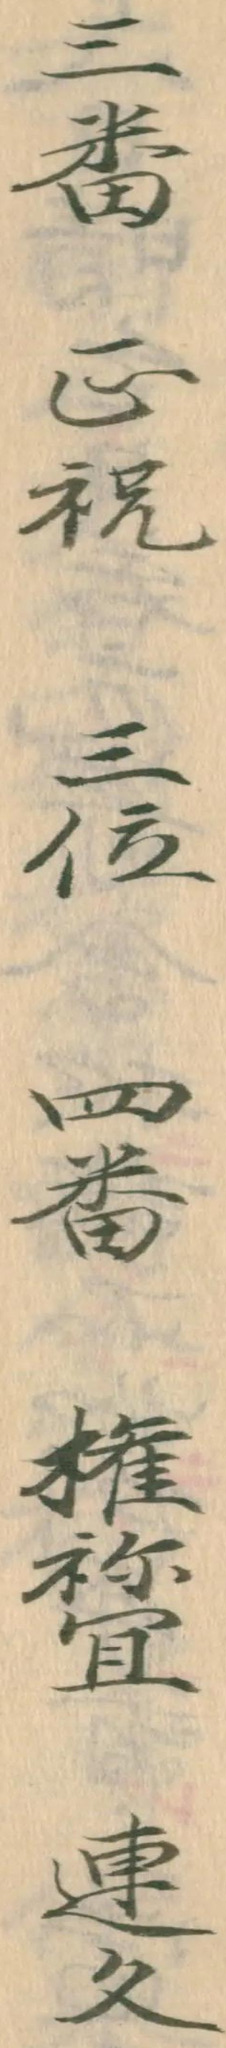三番正祝三位四番権祢宜連久
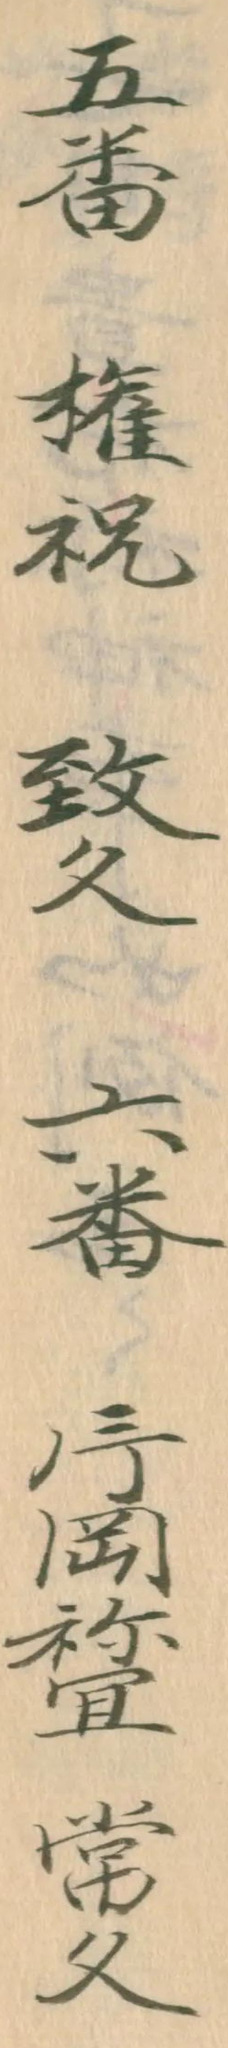五番権祝致久六番片岡祢宜常久
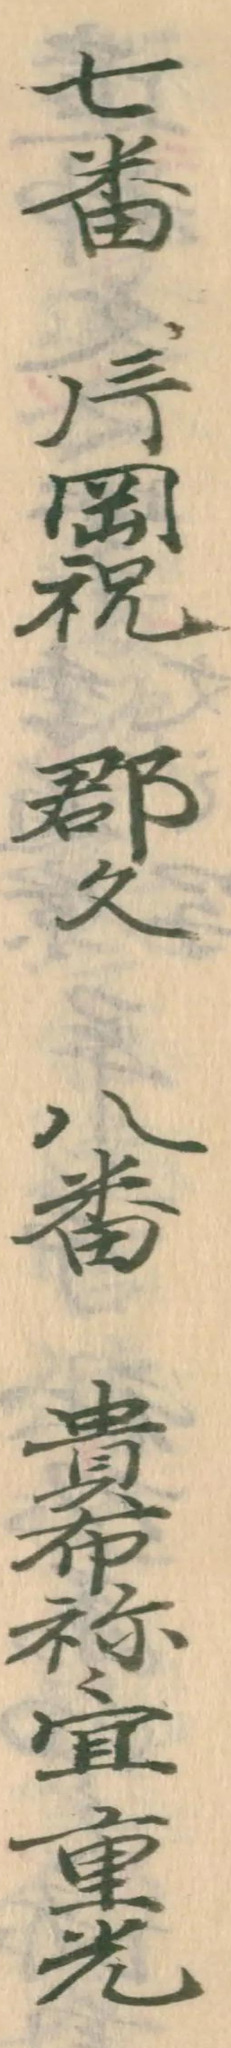七番片岡祝郡久八番貴布祢々宜重光
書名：賀茂社記録. 第15冊
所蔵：国立国会図書館 National Diet Library, JAPAN
